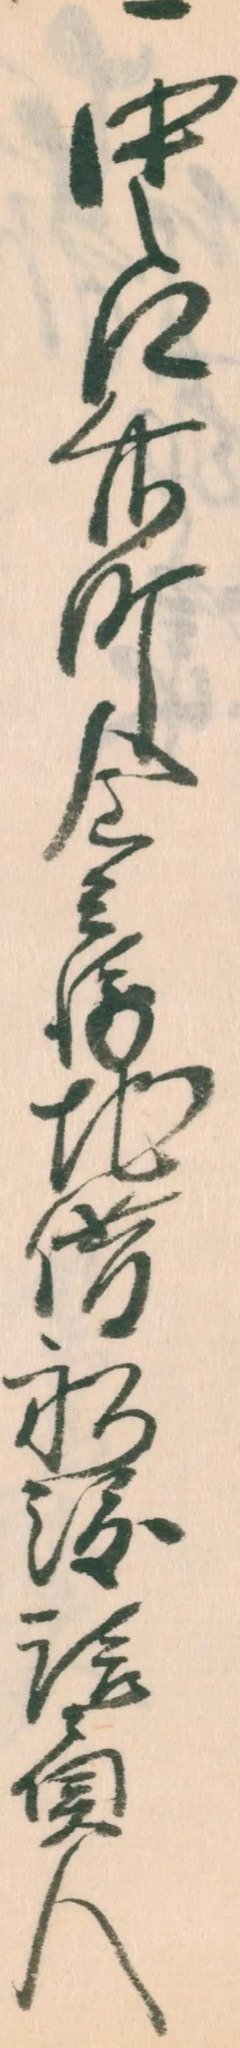一中之郷竹町金兵衛地借船渡請負人
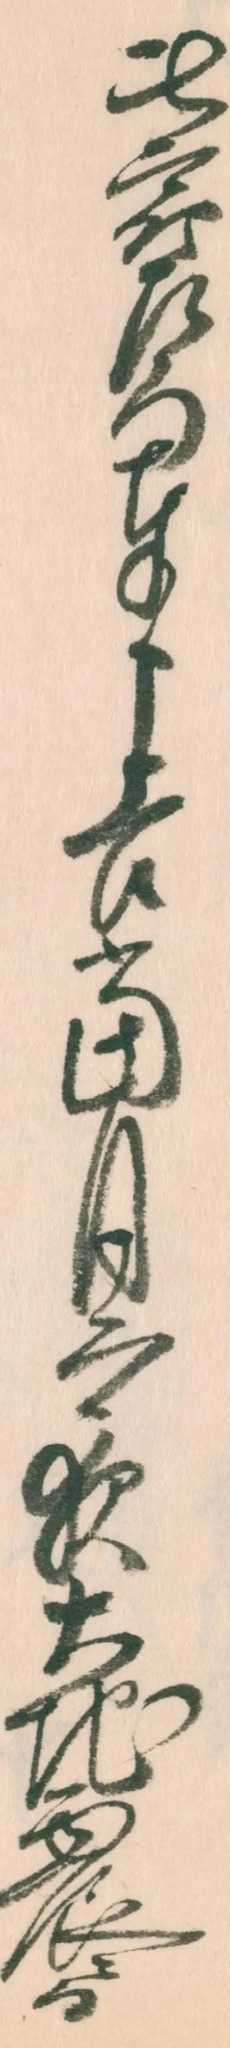次郎左衛門奉申上候当月二日夜大地震ニ而
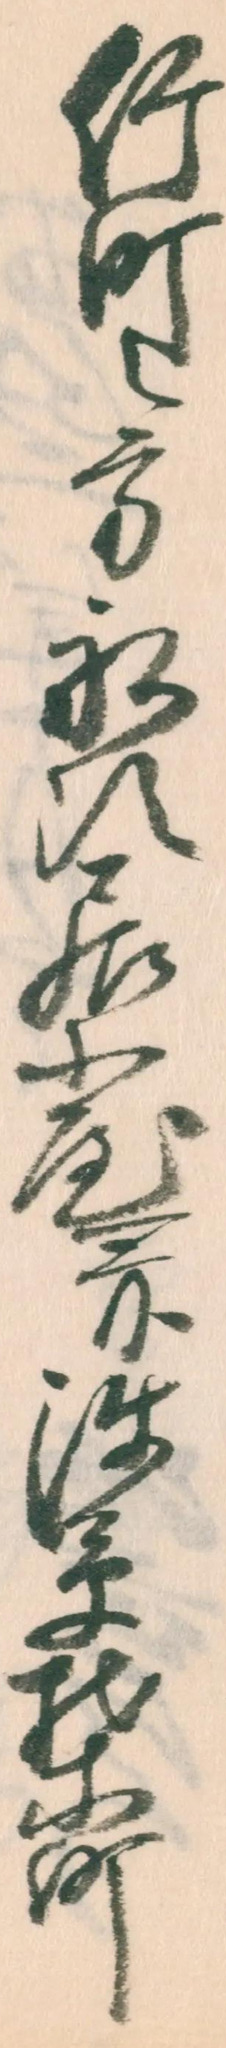竹町之方船頭居小屋并浅草材木町
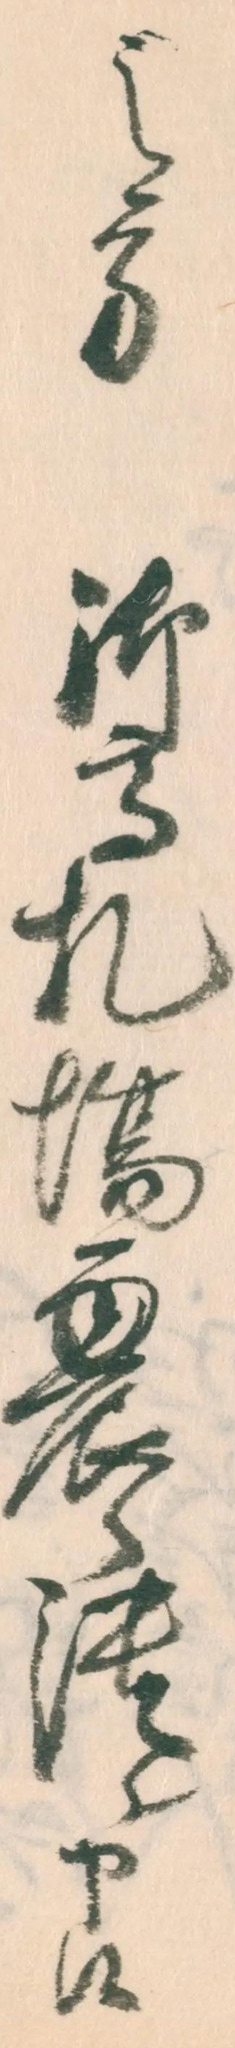之方御高札場震り潰レ申候
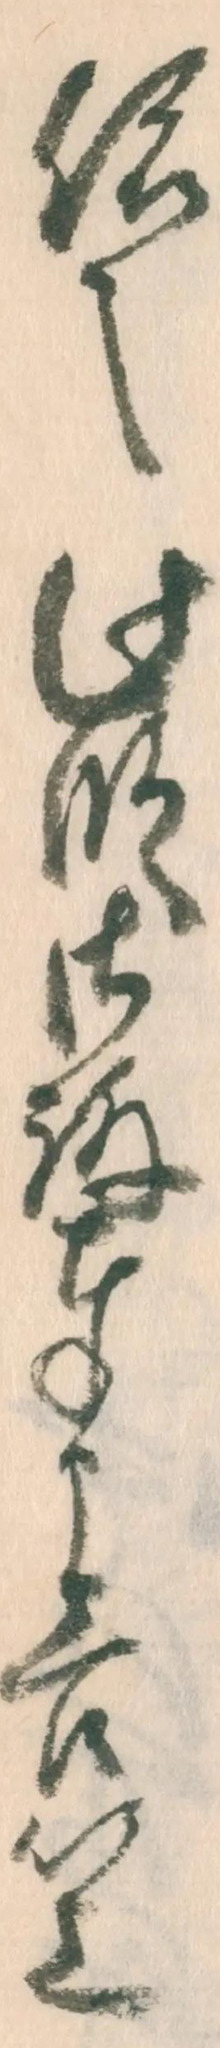依之此段御訴奉申上候以上

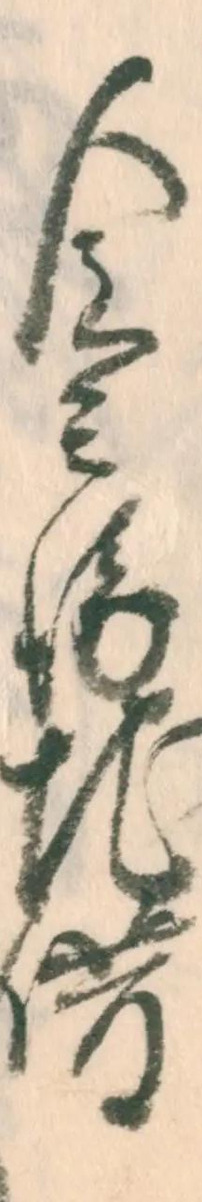金兵衛地借
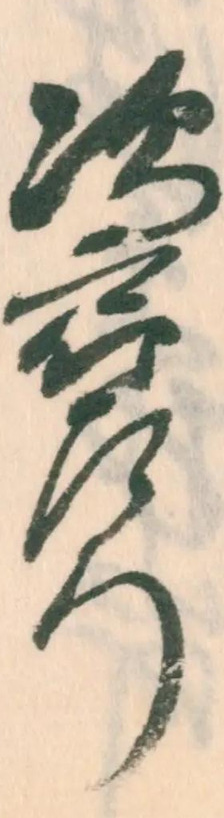次郎左衛門
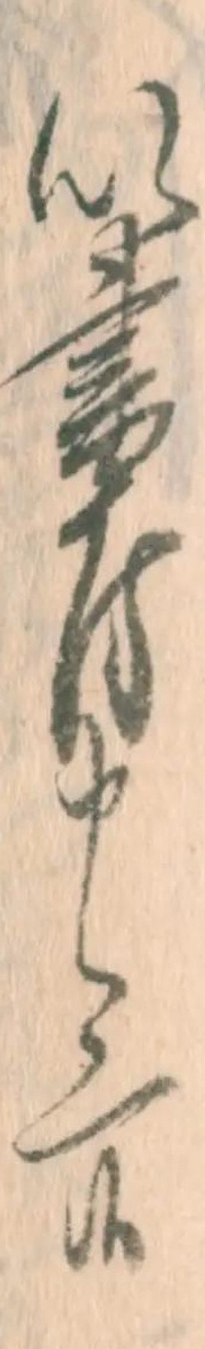以書付申上候
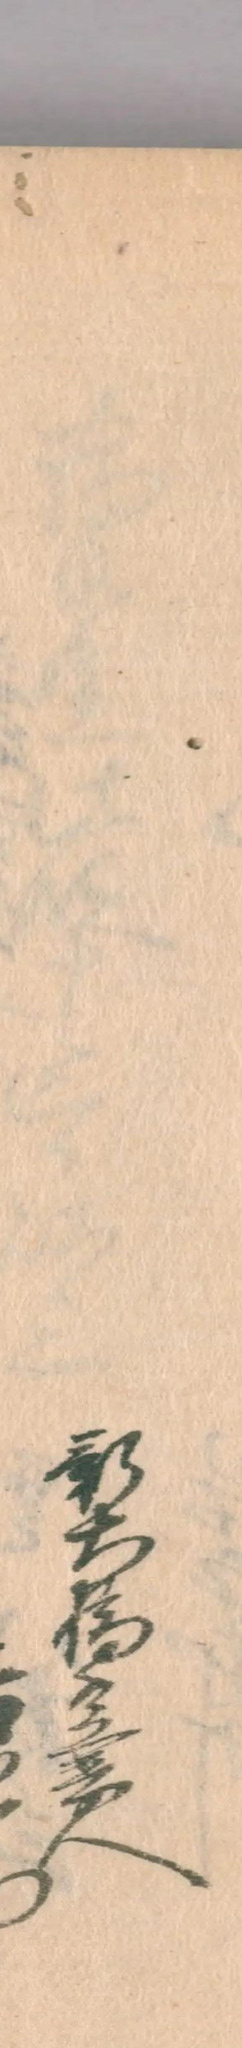新大橋定番人
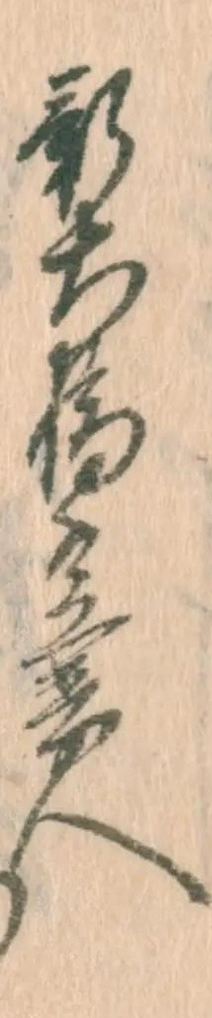新大橋定番人
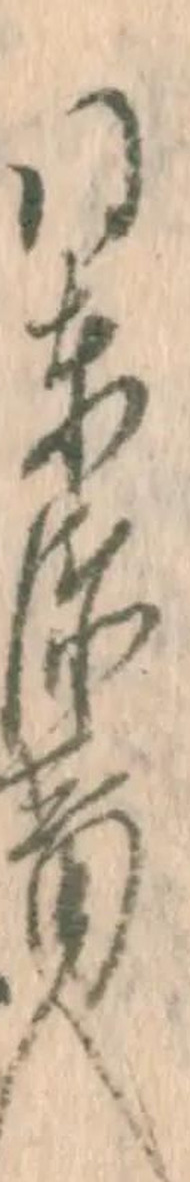同東添番人
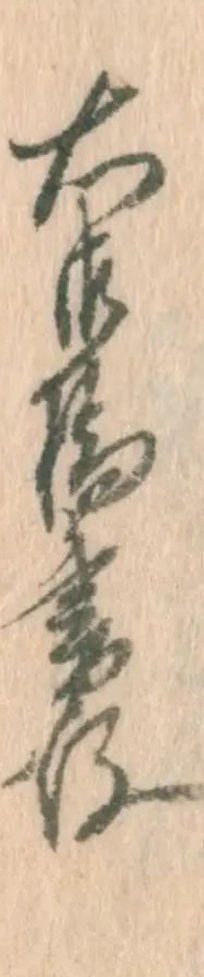右御橋書役
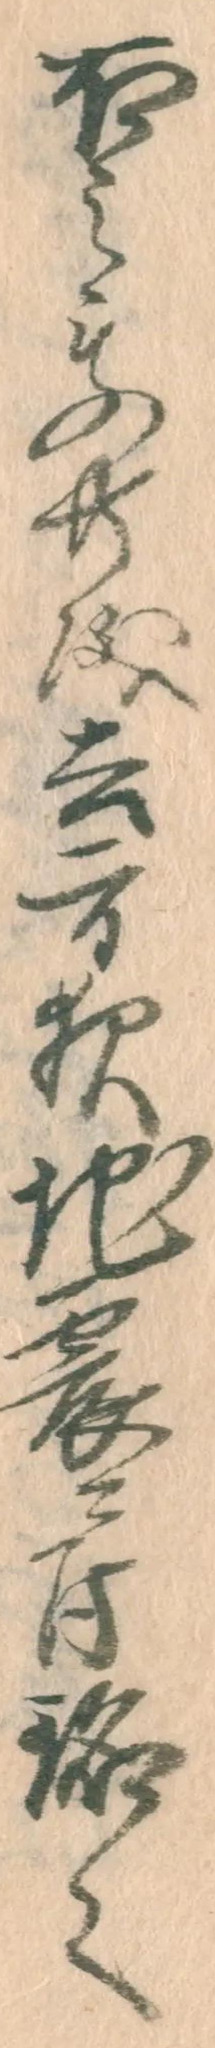右之もの共儀去二日夜地震ニ付銘々

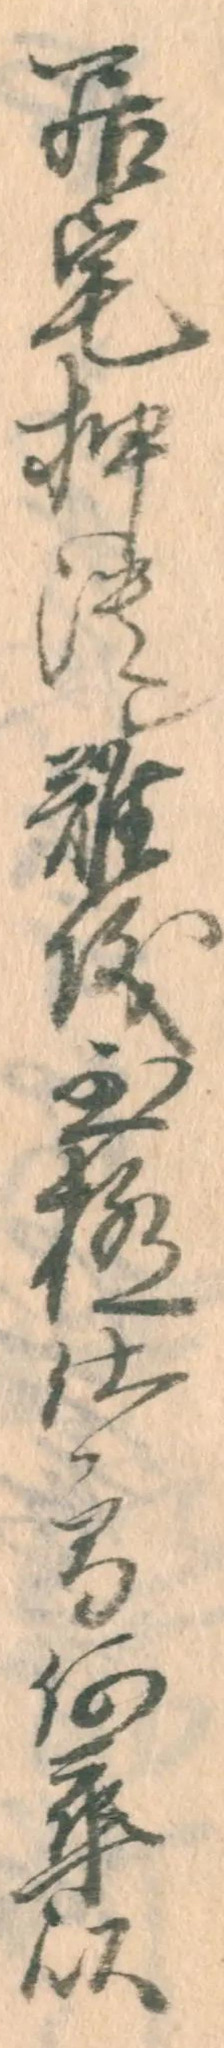居宅押潰レ難儀至極仕候間何卒以
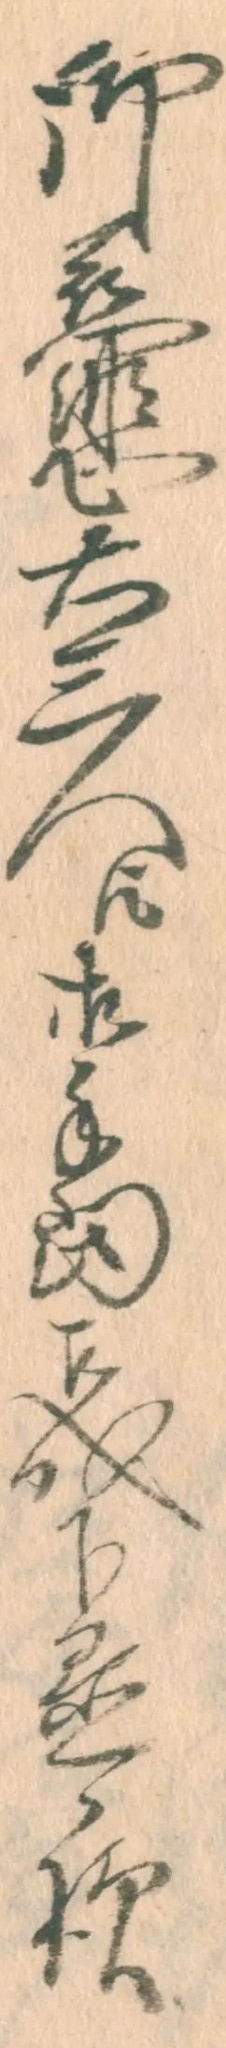御慈悲右三人え御手当被成下置候様
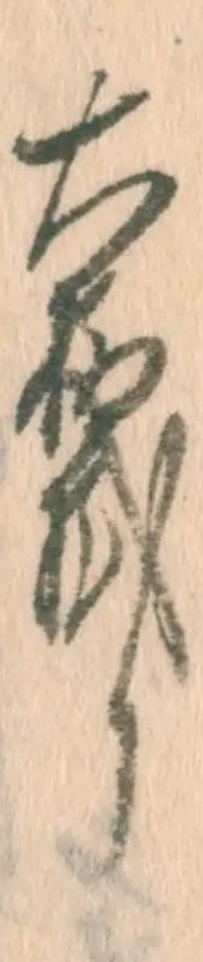大橋懸り
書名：地震災書留 2巻. [1] 内表紙に「地震災書留　安政二卯年　但本所深川御用屋敷地代免除調」とあり
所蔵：国立国会図書館 National Diet Library, JAPAN
